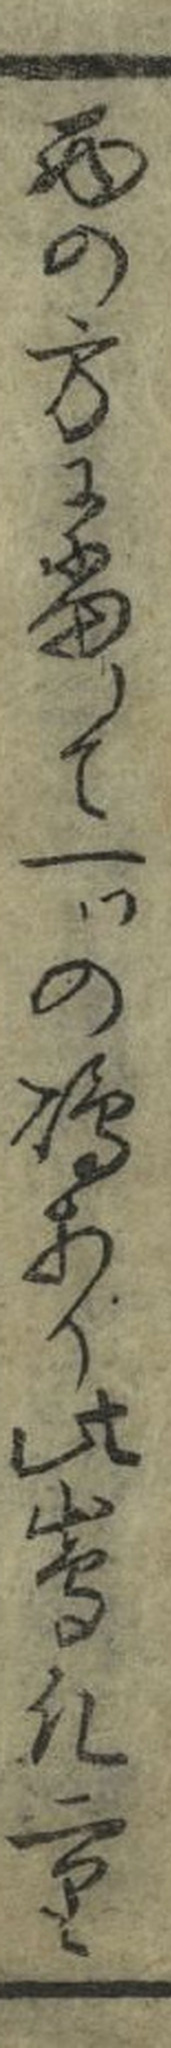西の方に当りて一ツの島あり此島凡二里
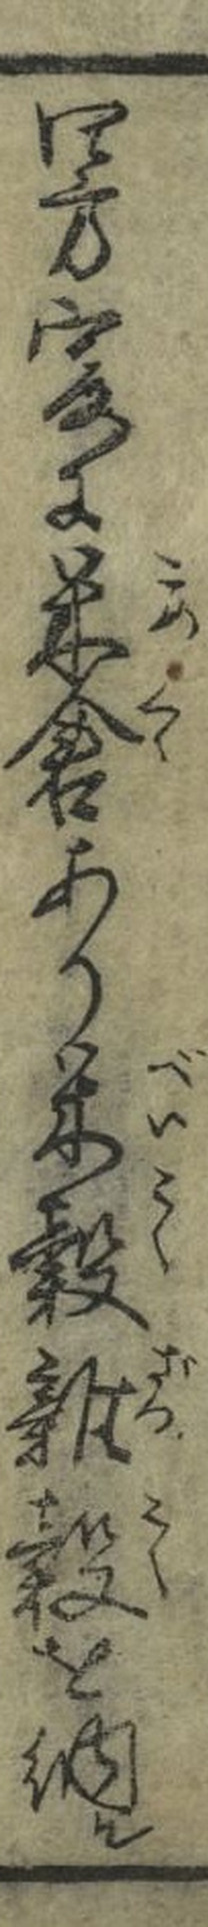四方爰に米倉あり米穀雑穀を納る
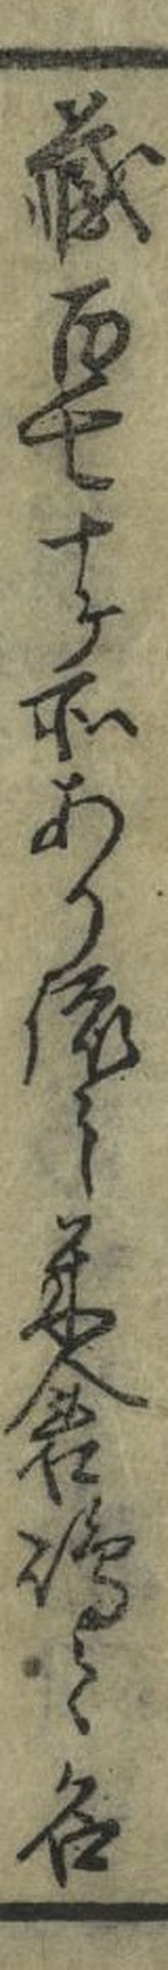蔵百七十ヶ所あり依て米倉島と名
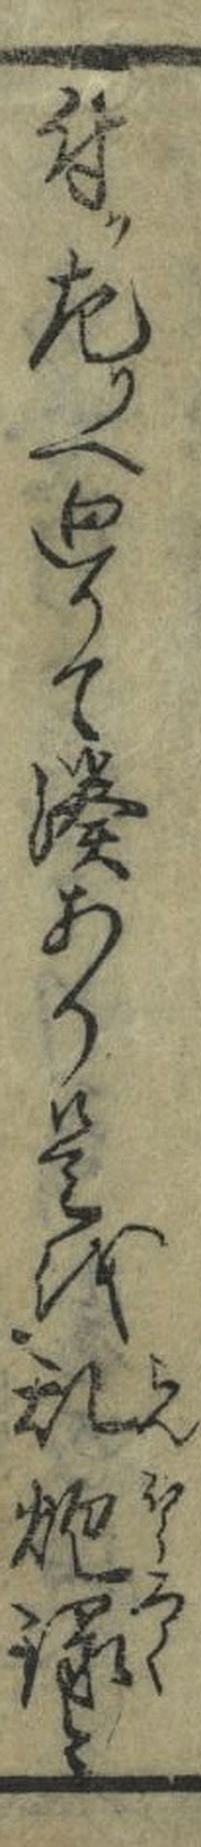付く左りへ廻りて湊あり是を乱炮録と
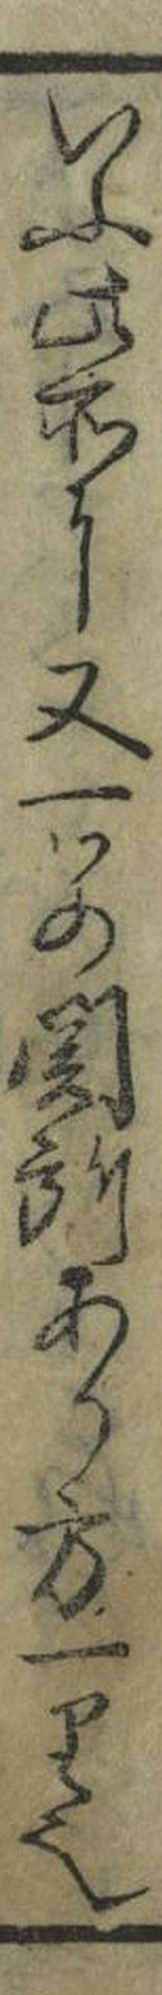いふ此所に又一ツの関所あり方一里也
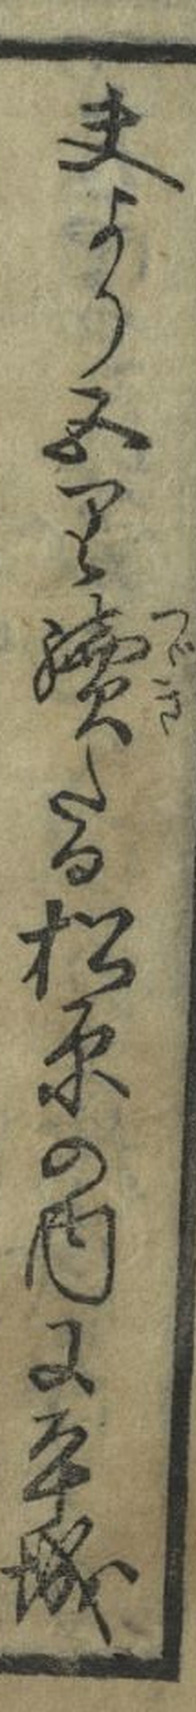夫より五里続たる松原の内に平城
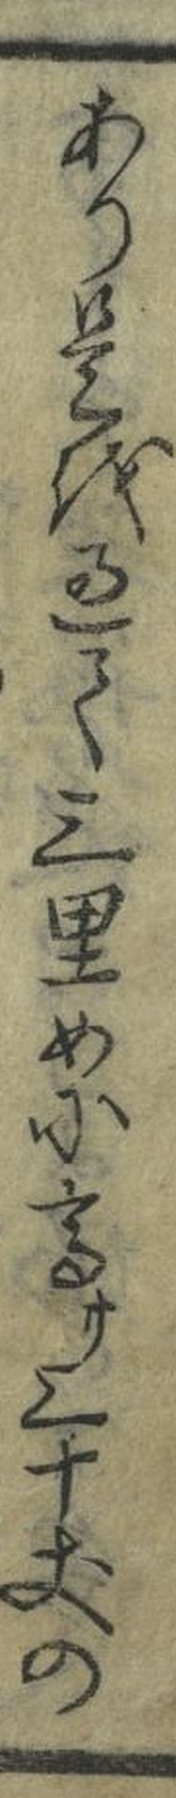あり是をへて三里めに高さ三十丈の
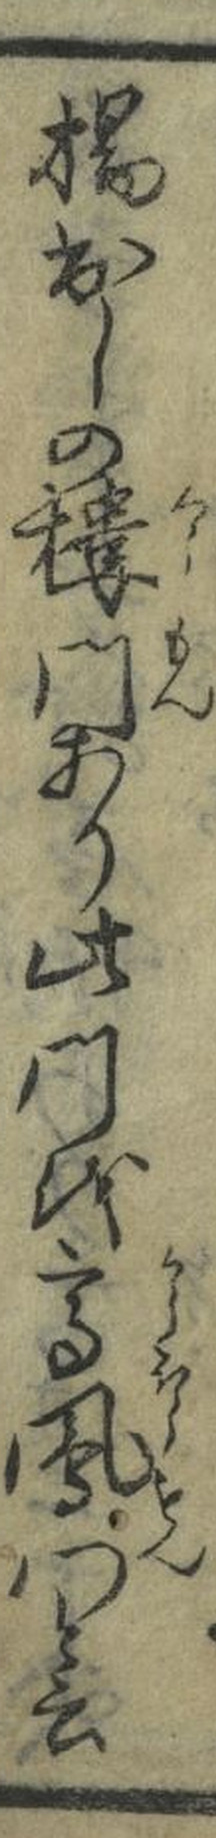揚出しの楼門あり此門を高鳳門と云
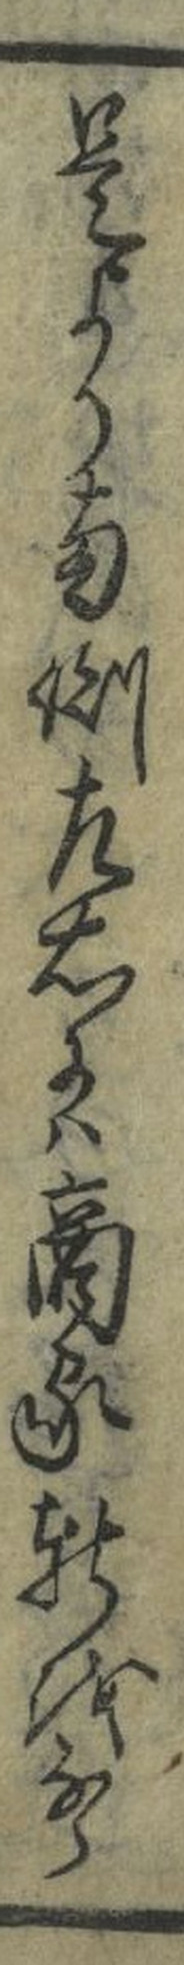是より南側左右には商家軒をなら
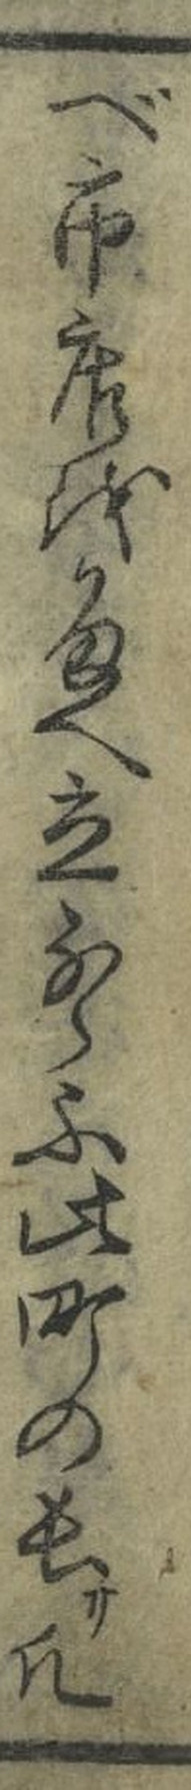べ市店をかまへ立ならふ此町の長さ凡
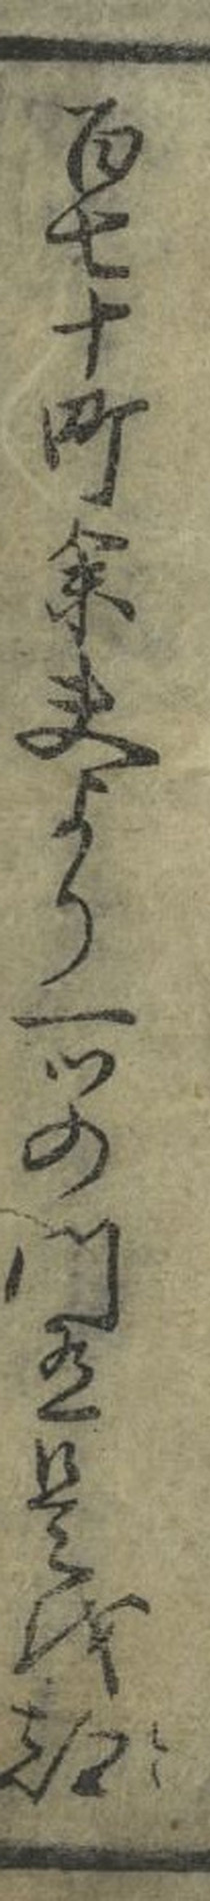百七十町余夫より一ツの門有是を都

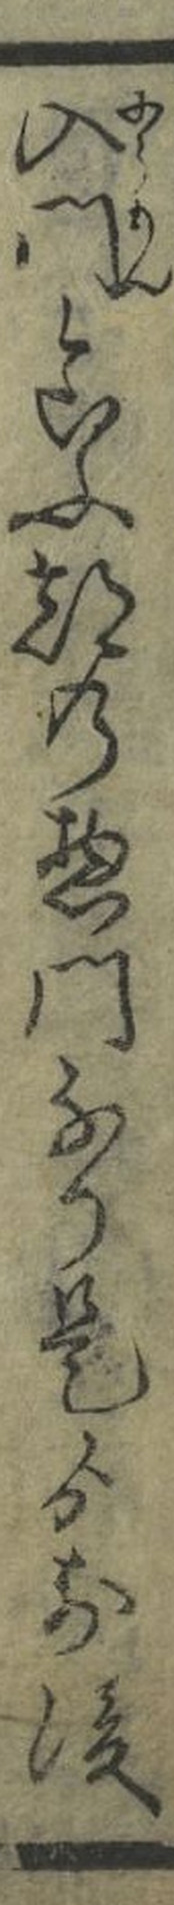入門といふ都の惣門なり是ゟ前後
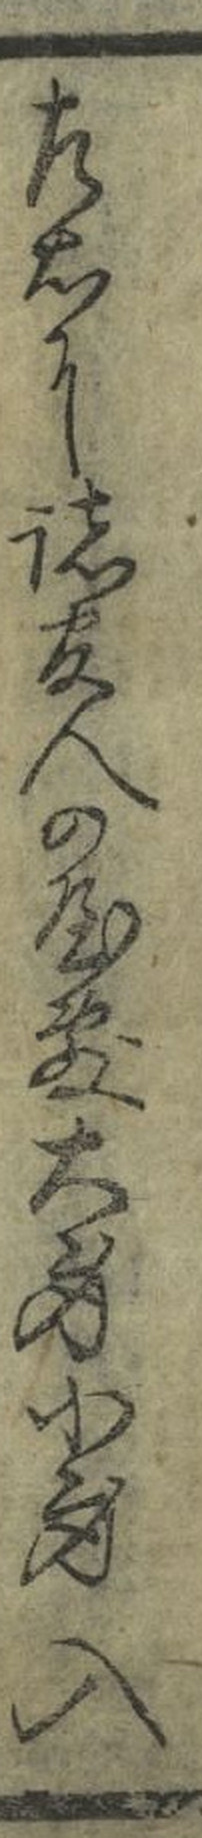左右に諸官人の屋敷大身小身入
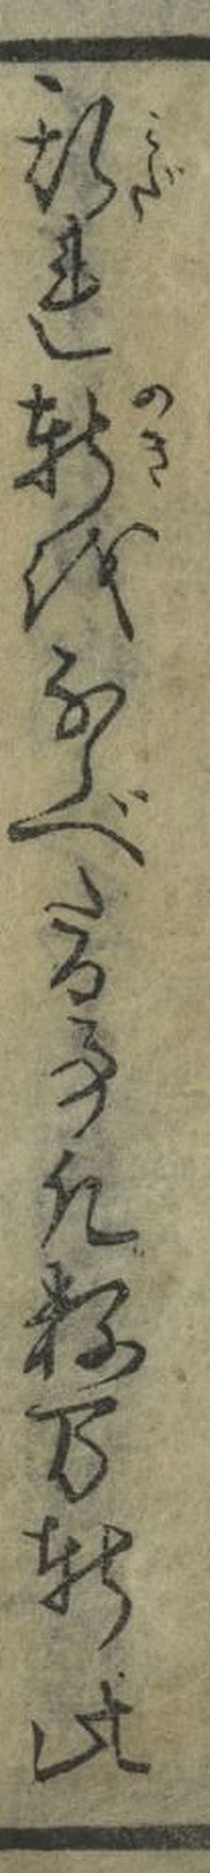乱れ軒をならべたる事凡数万券軒此
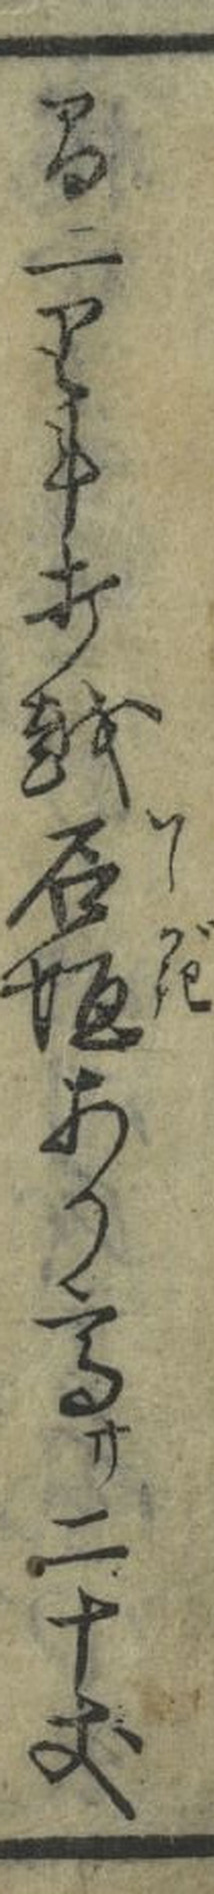間一里斗打越石垣あり高さ二十丈
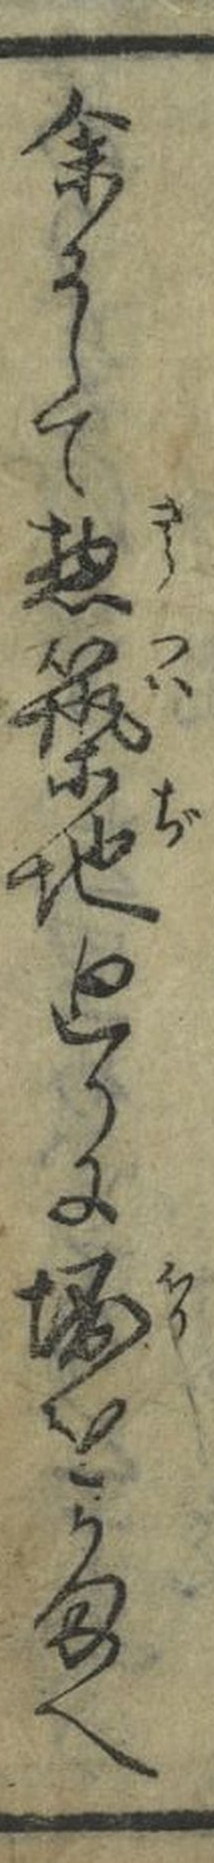余にして惣築地廻りに堀をかまへ
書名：琉球雑話
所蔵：University of the Ryukyus Library
